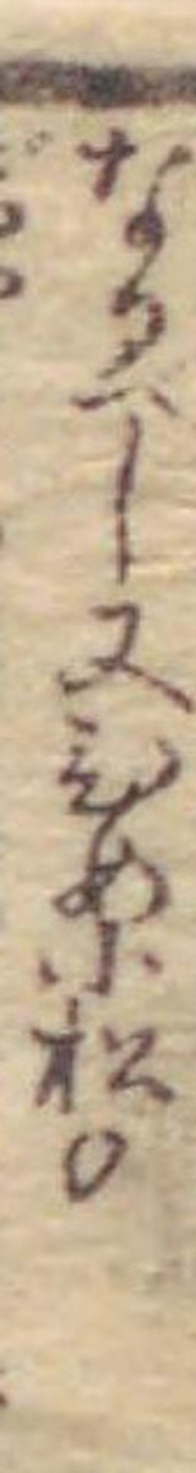なるへし又ひめ小松の
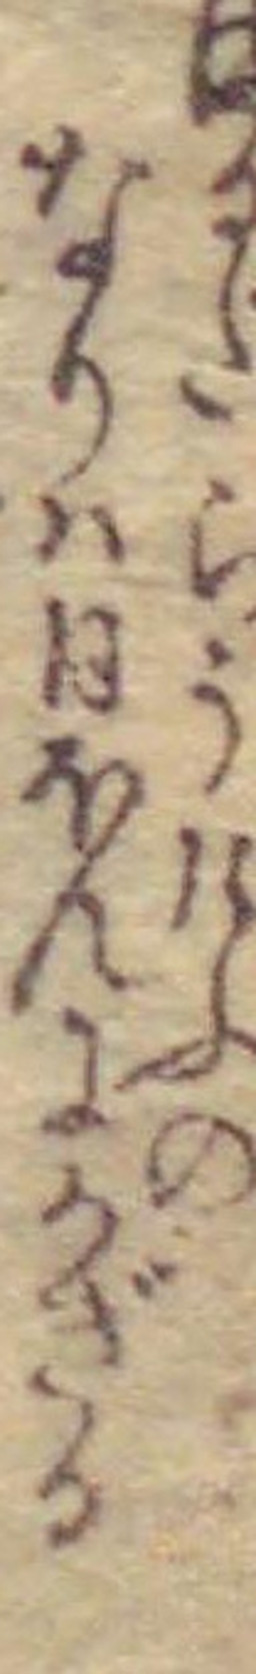なりは日ほんにかぎる
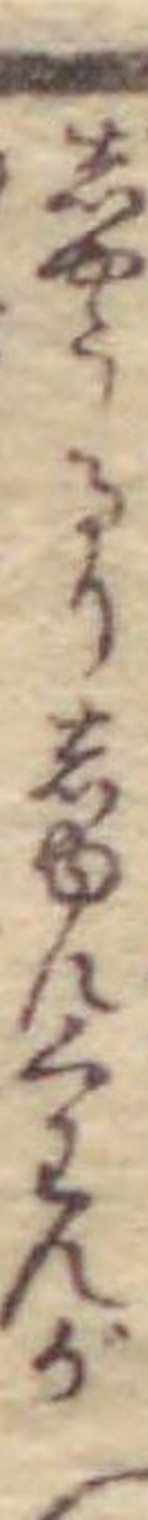じやうるりしゆんくわんが
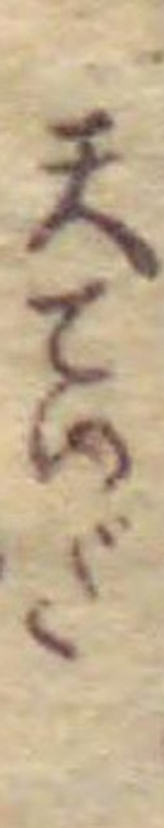天ていだ
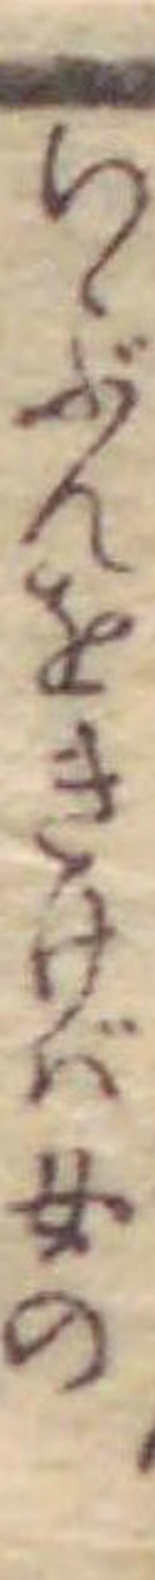いゝぶんをきけば女の
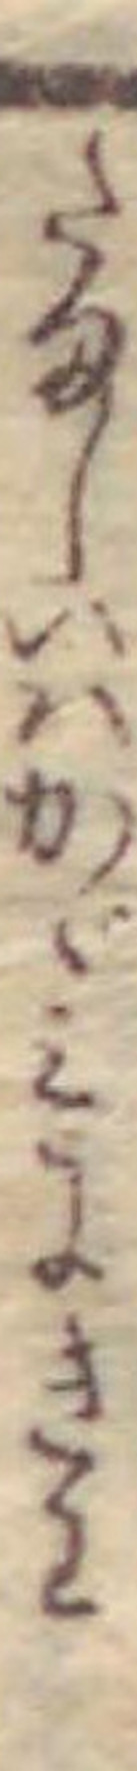たましいは加賀みにきわ
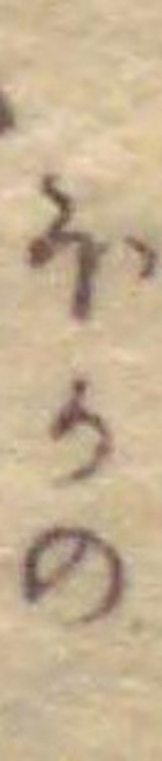ほかの
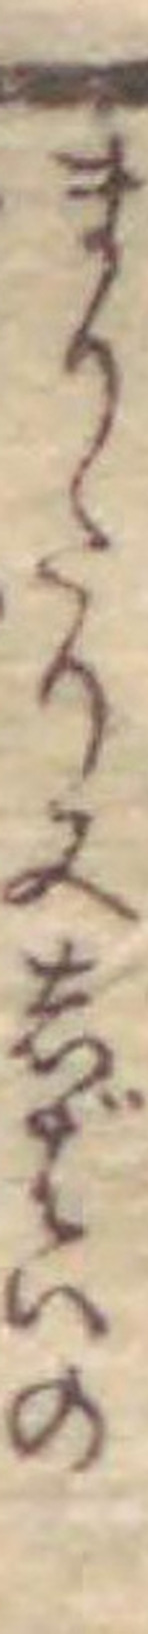まりたり又しばいの
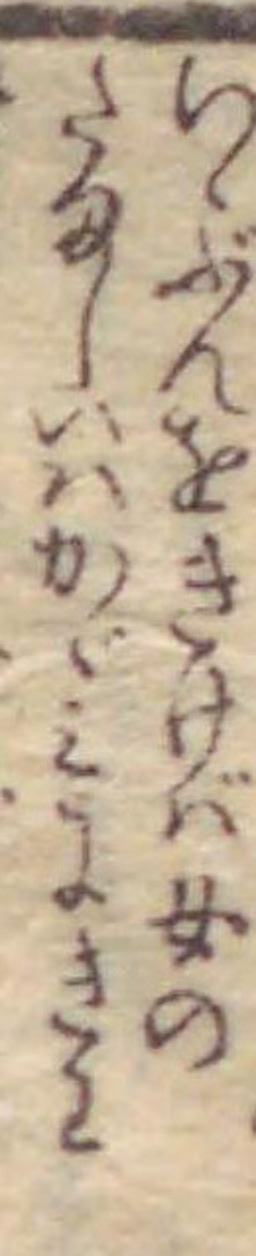たましいは加賀みにきわ
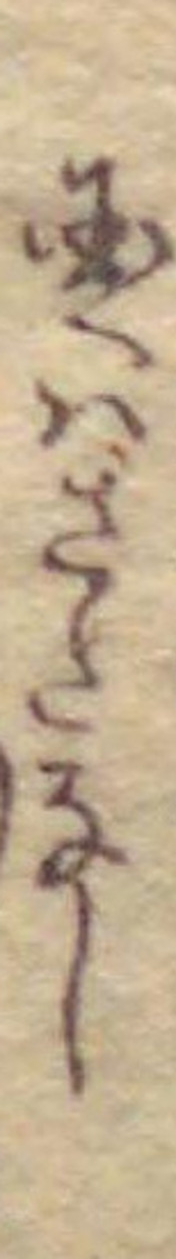国へはさたなし
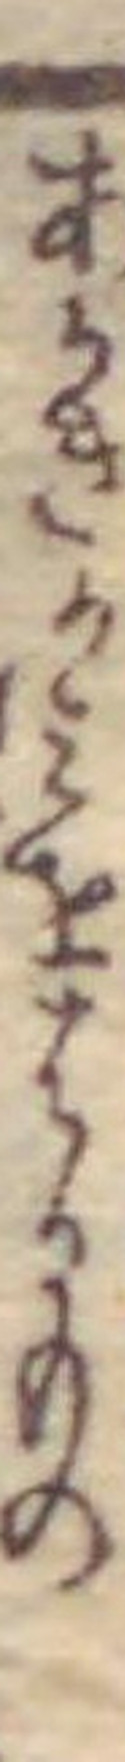あかきかみをはるもの
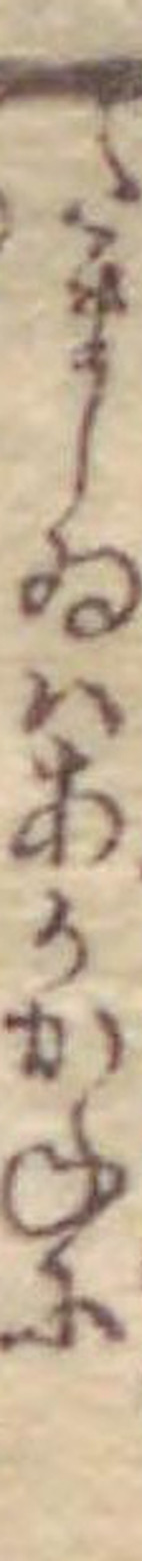たましゐはあかかねに
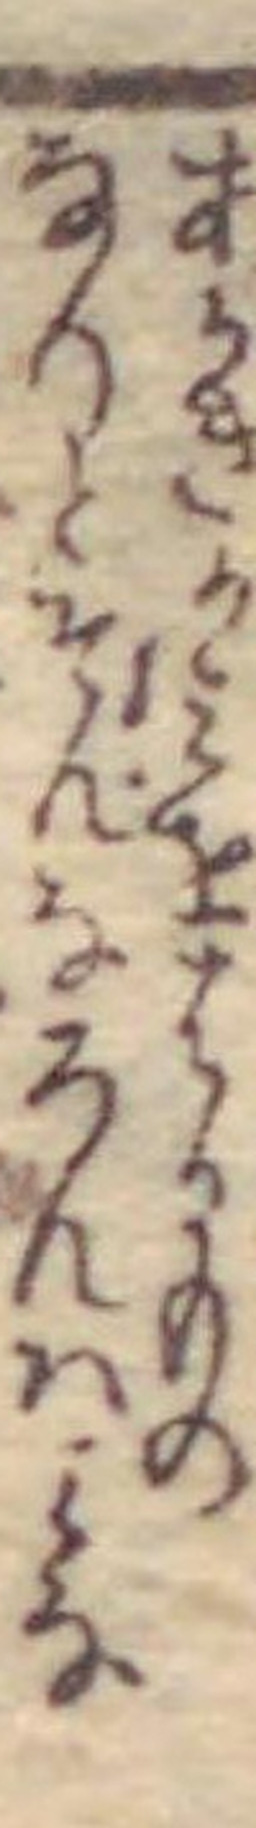なりとそんなろんはみな
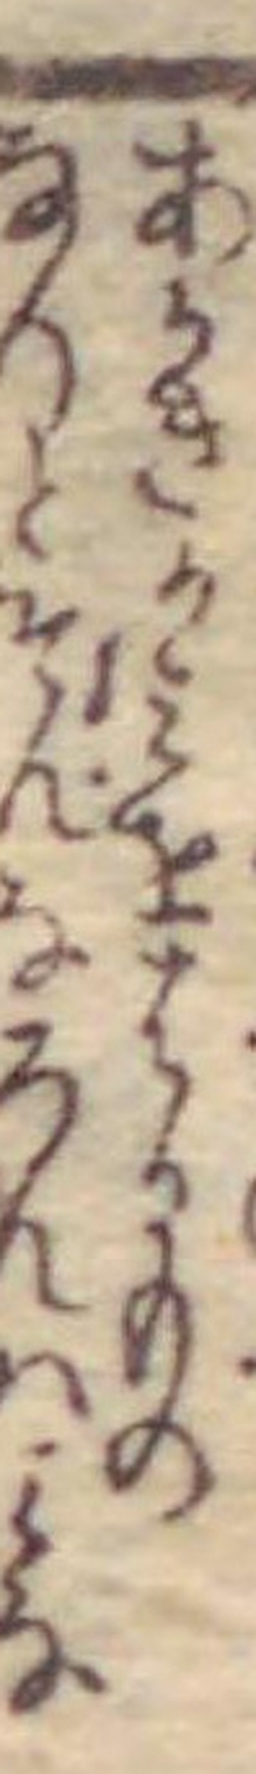なりとそんなろんはみな
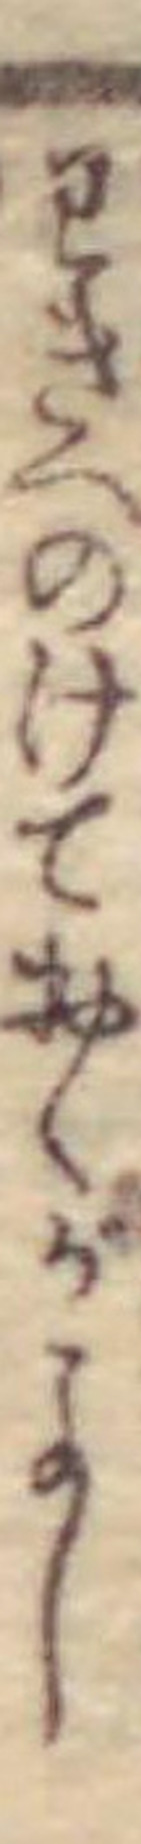わきへのけておくがよし
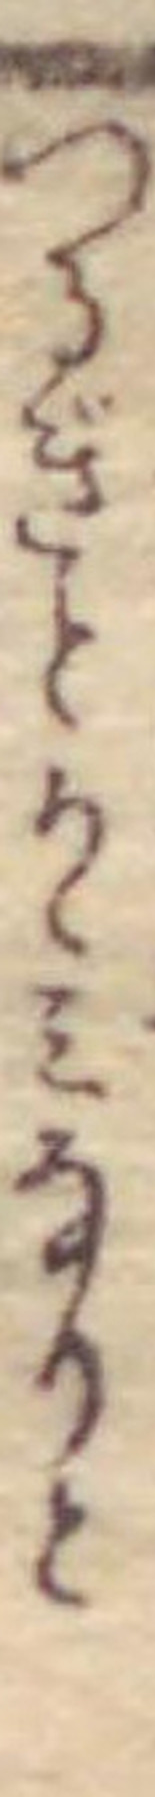つるぎとかゝみなりと
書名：心学早染艸 : 3巻
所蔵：国立国会図書館 National Diet Library, JAPAN
